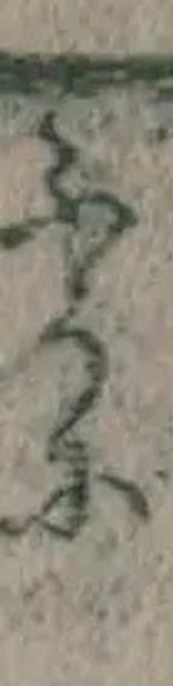ふうに
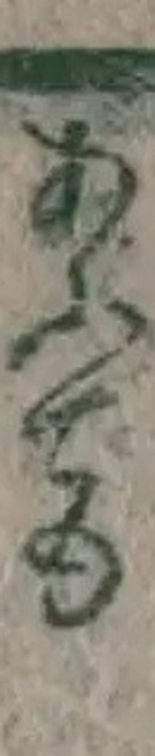あふても
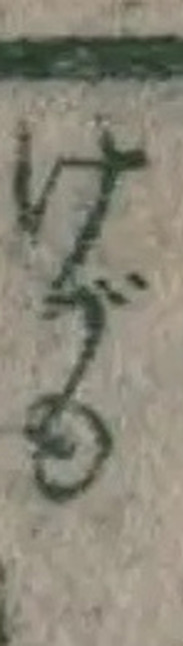けがも
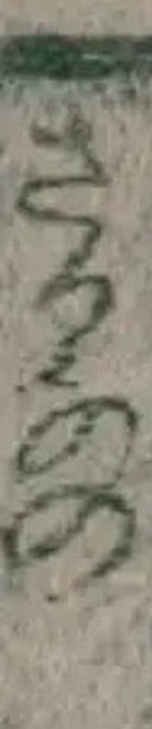さかなの
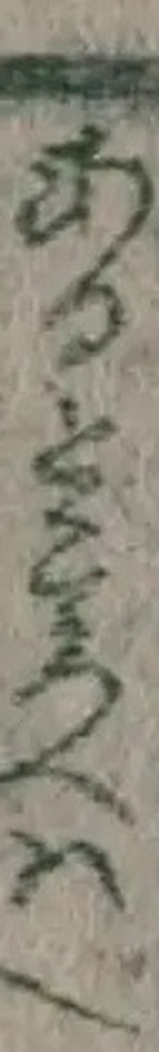あるところへは
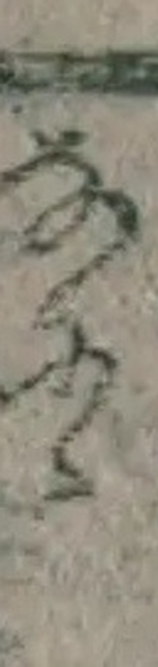なにゝ
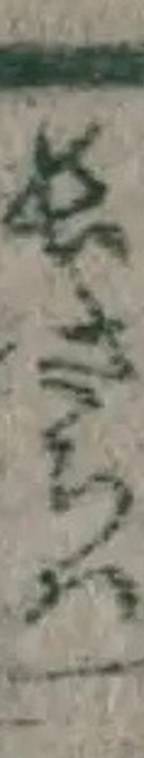長きちは
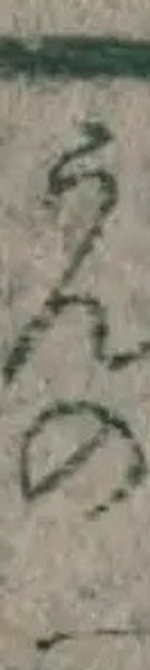うんの
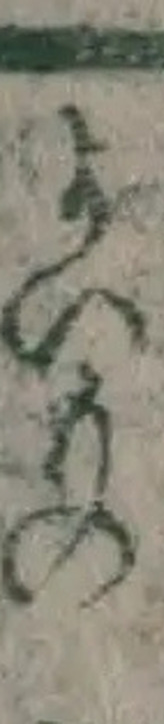よいもの

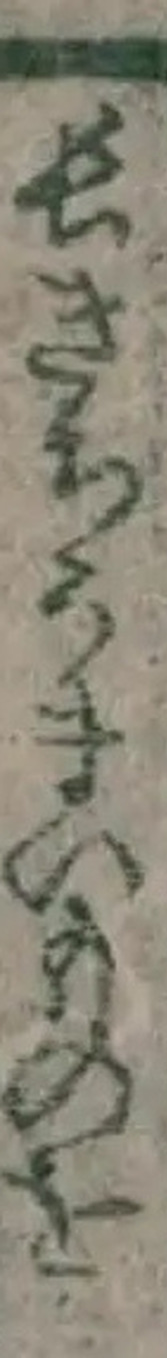長きちうまいものを
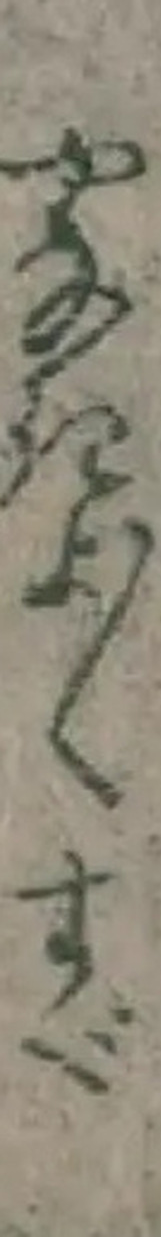やなぎよ〳〵すぐ
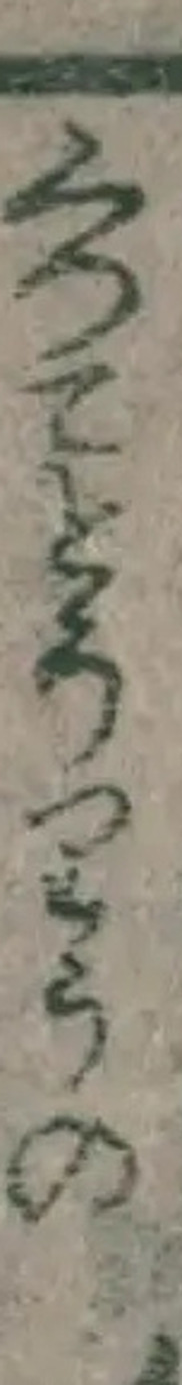くつてとうりうの
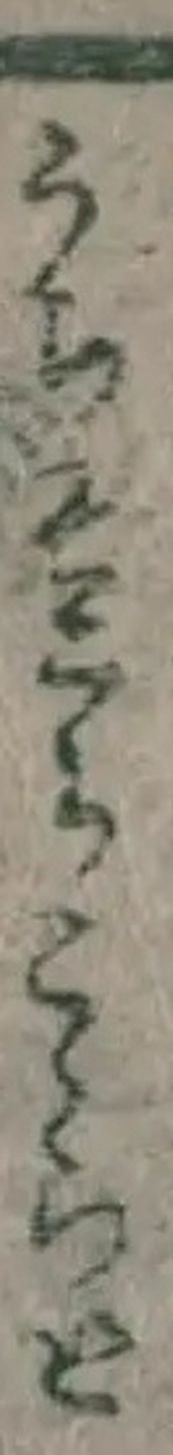うちそこらこゝらと
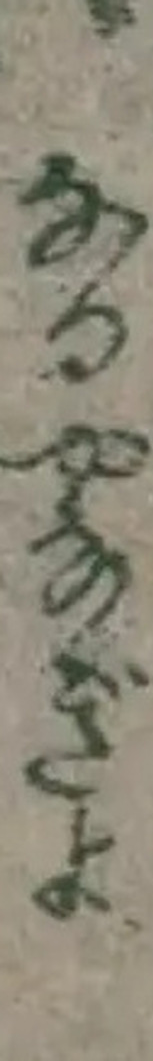なるやなぎよ
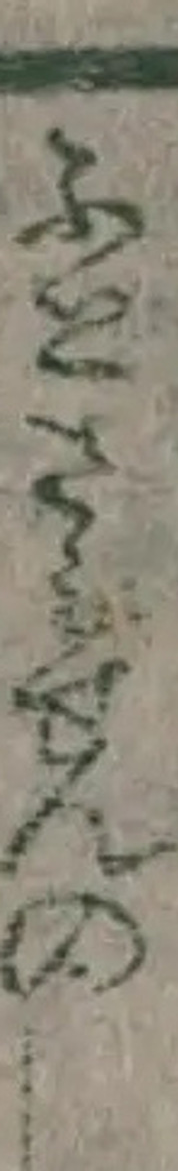ふとさみせんの
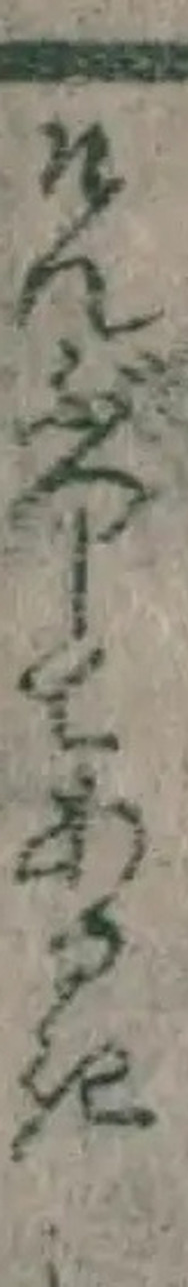けんぶつしてあるき
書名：縦筒放唐の噺 3巻
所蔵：国立国会図書館 National Diet Library, JAPAN
